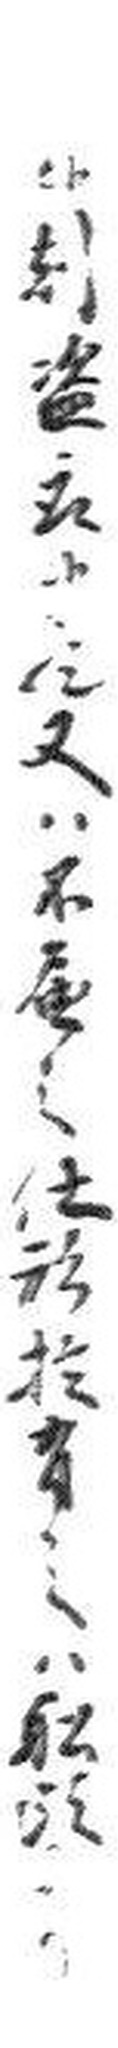候刻盗取候歟又ハ不届之仕形於有之ハ船頭より
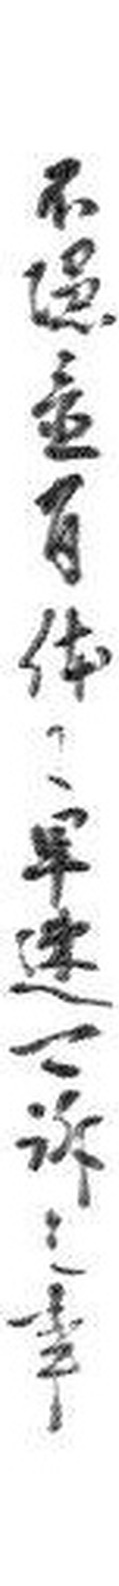不隠置有体に早速可訴之事
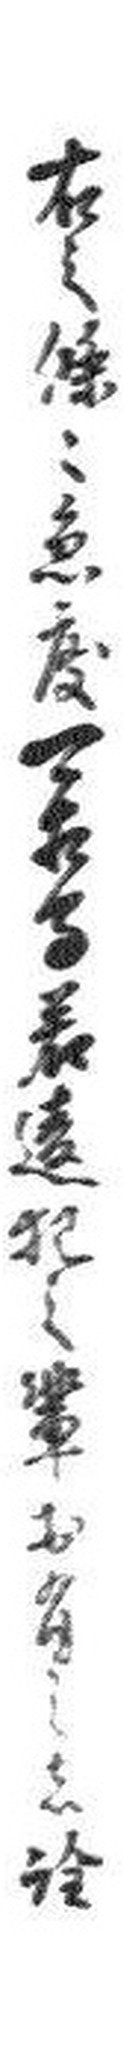右之條々急度可相守若違犯之輩於有之者詮
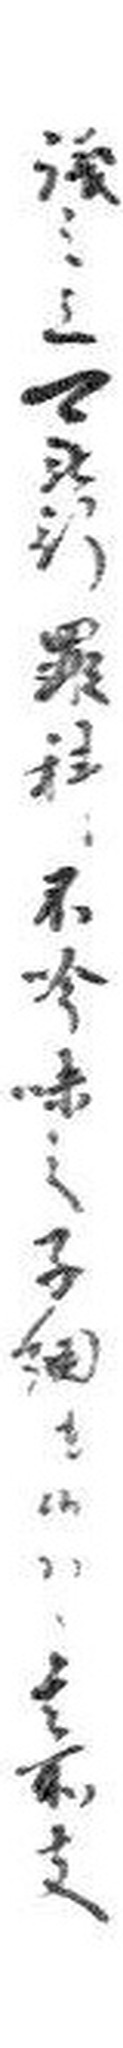儀之上可被行罪科不吟味之子細も候ハゝ其所支
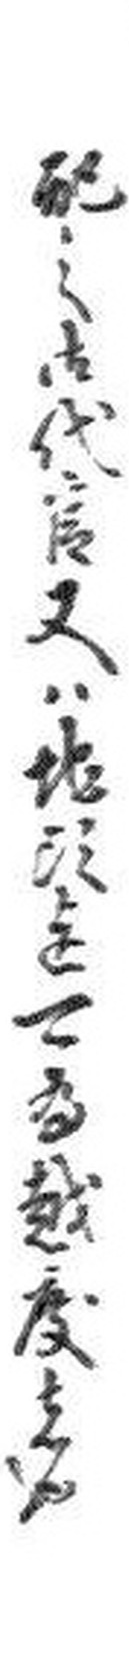配之御代官又ハ地頭迄可為越度者也
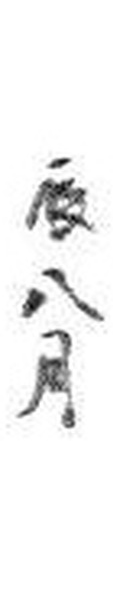辰八月
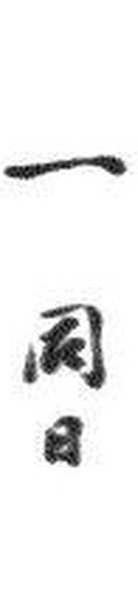一同日
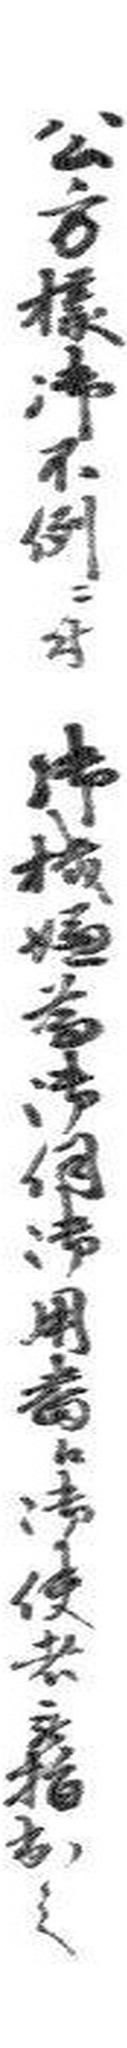公方様御不例ニ付御機嫌為御伺御用番江御使者被指出之
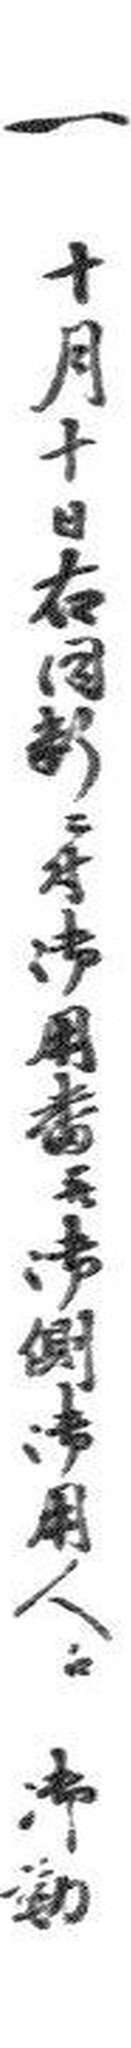一十月十日右同断ニ付御用番并御側御用人江御勤

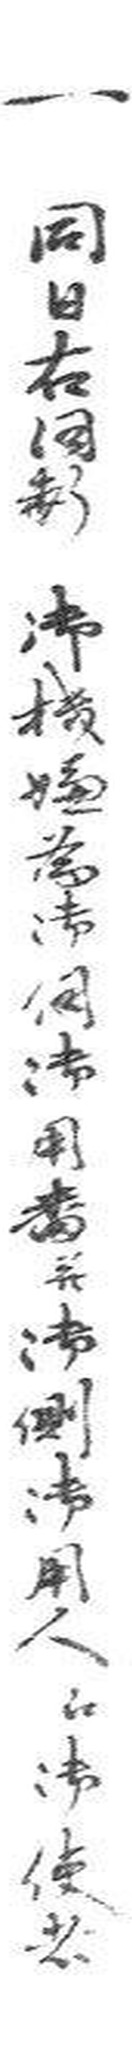一同日右同断御機嫌為御伺御用番并御側御用人江御使者
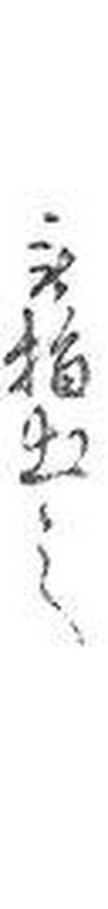被指出之
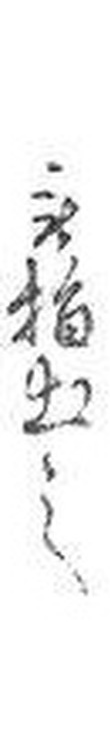被指出之
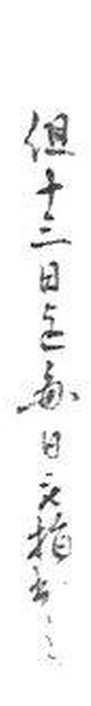但十三日迄毎日被指出之
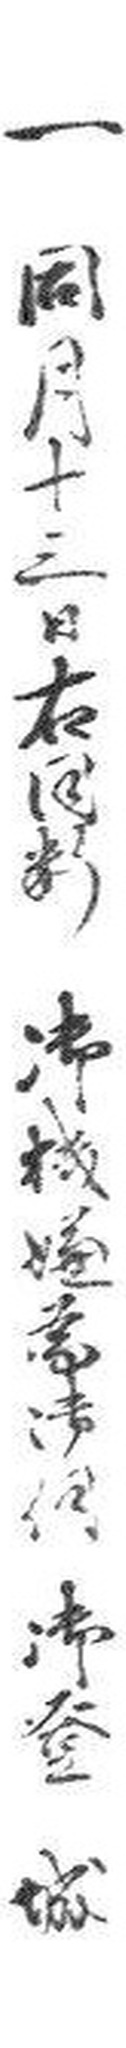一同月十三日右同断御機嫌為御伺御登城
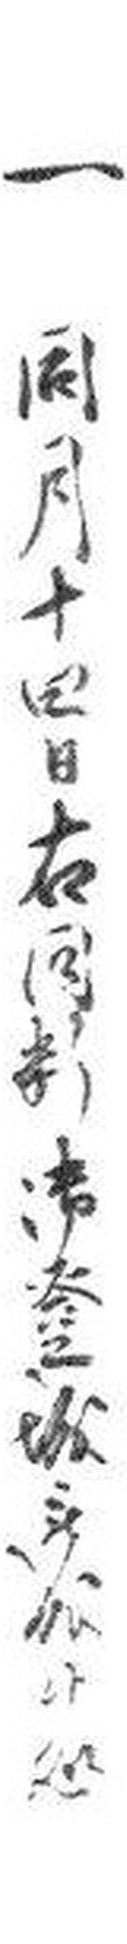一同月十四日右同断御登城被成候処
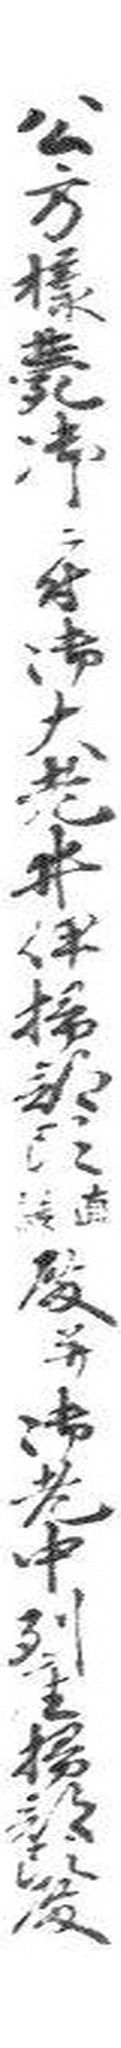公方様薨御ニ付御大老井伊掃部頭直興殿并御老中列座掃部頭殿
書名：家譜 二十九 吉邦公 従正徳二年到正徳三年
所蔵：福井県文書館 Fukui Prefectural Archives
